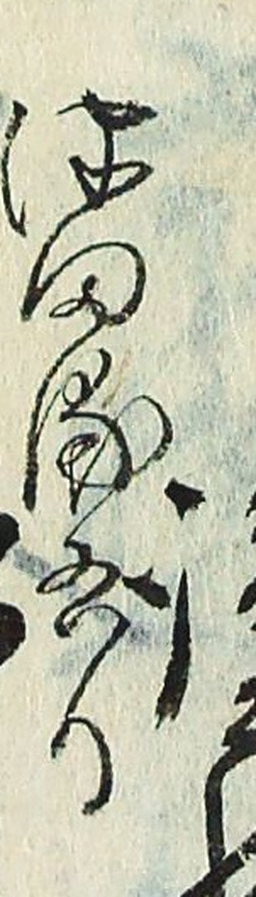津田浦右同
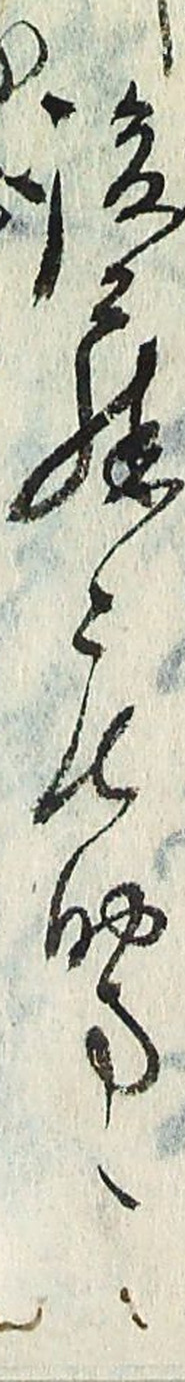後藤庄助方へ
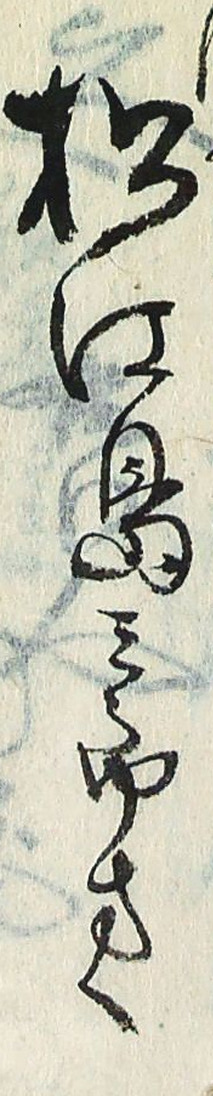松江島三郎方へ
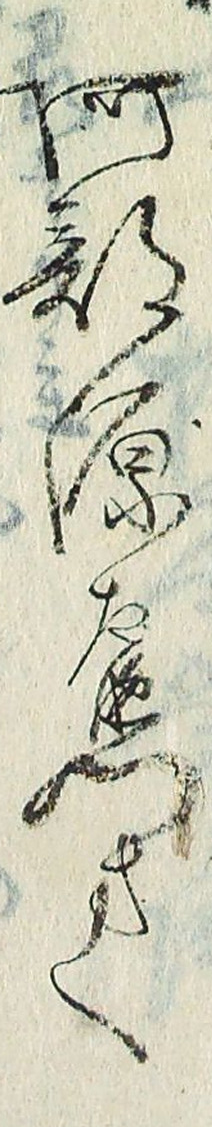阿部源左衛門方へ
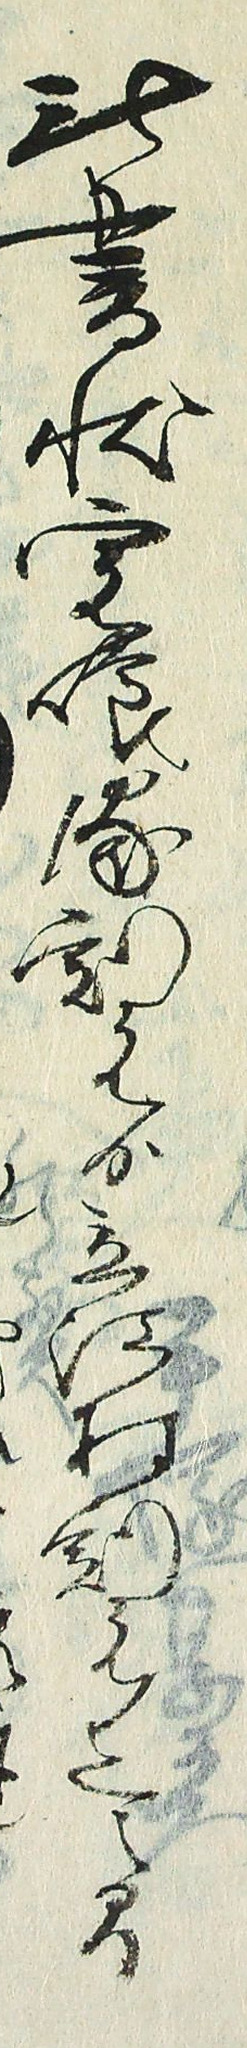此書状宍喰浦割元ゟ立江村割元迄之間
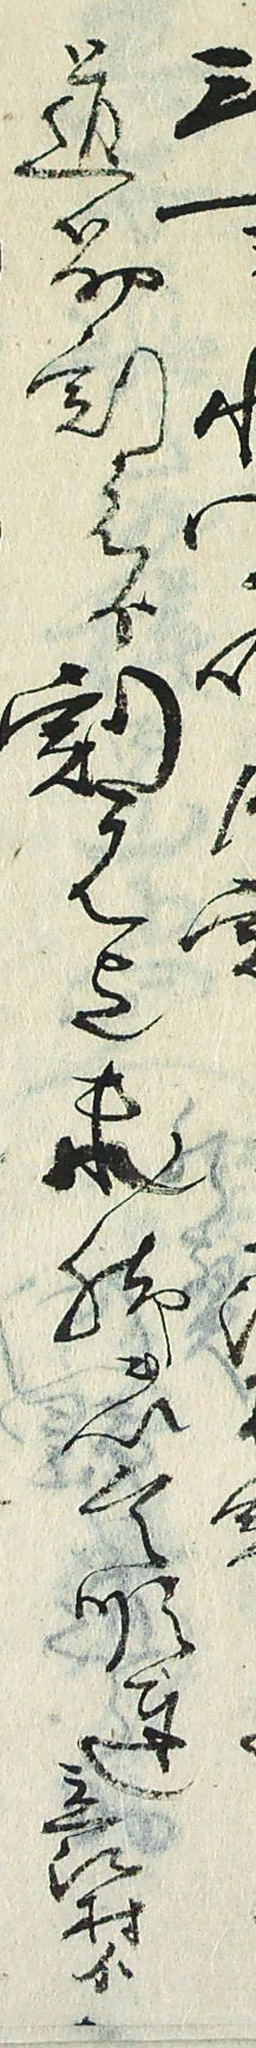道筋割元ゟ割元迄飛脚を以令順達立江村ゟ
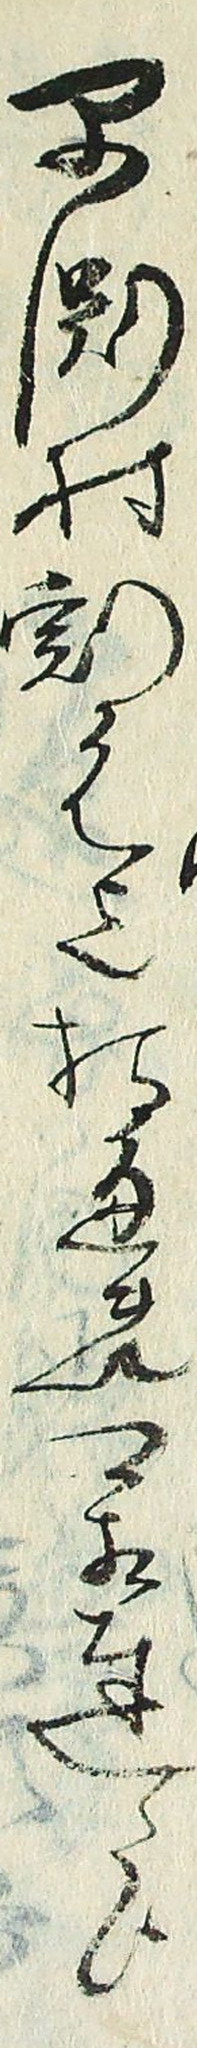早淵村割元迄持通を以可相達候以上
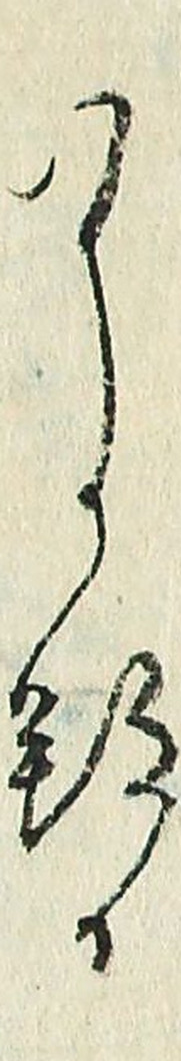八月朔日
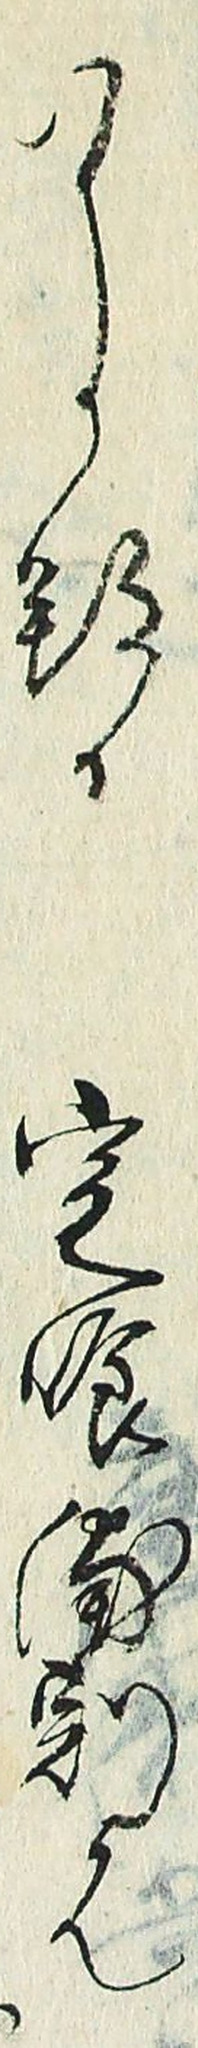八月朔日宍喰浦割元
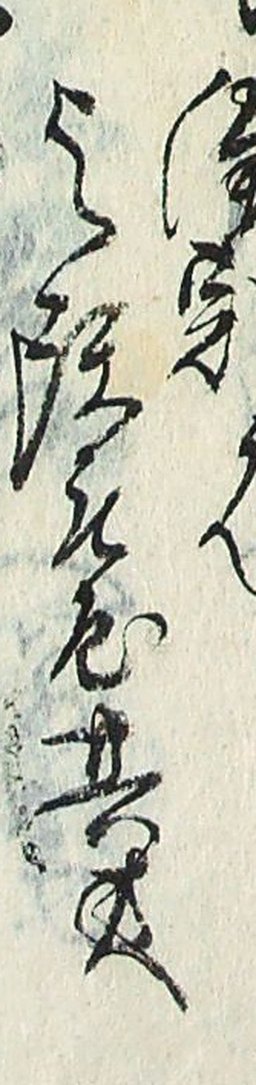与頭庄屋共方へ
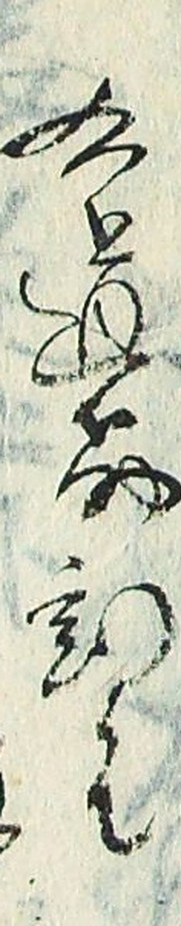右道筋割元
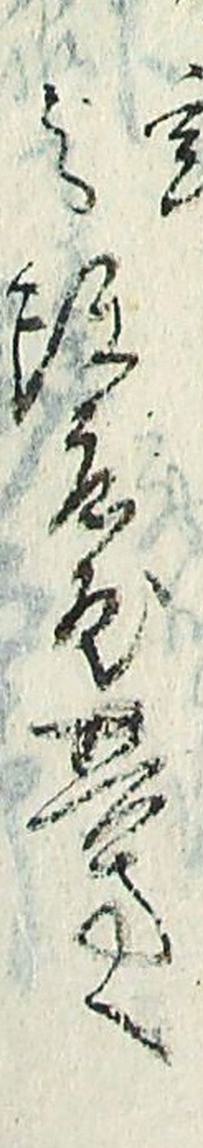与頭庄屋共方へ

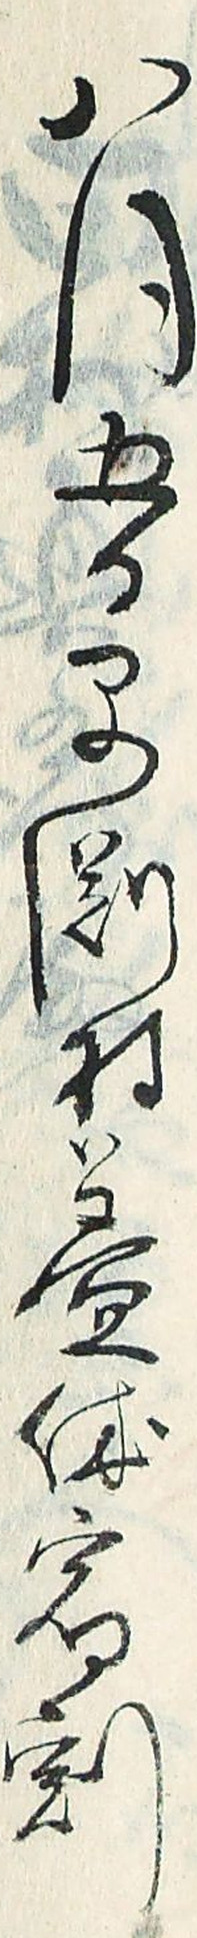八月五日早淵村御昼休宿割
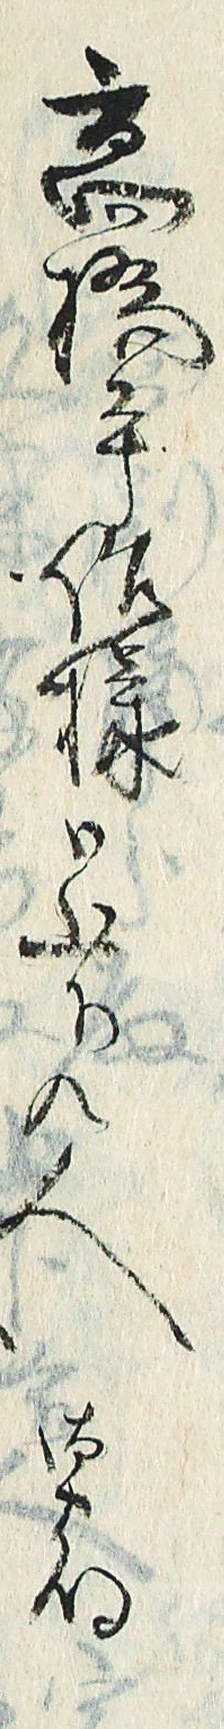高橋平作様御上下八人御宿
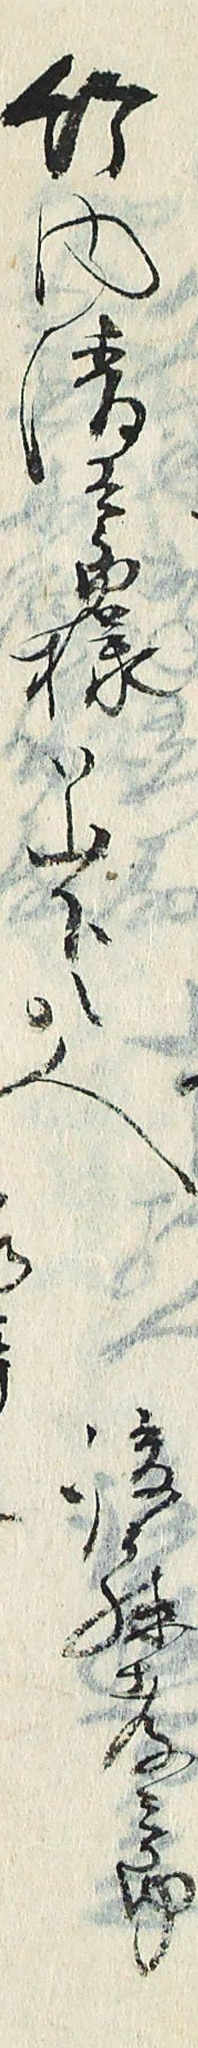竹内清太郎様御上下八人後藤孝三郎
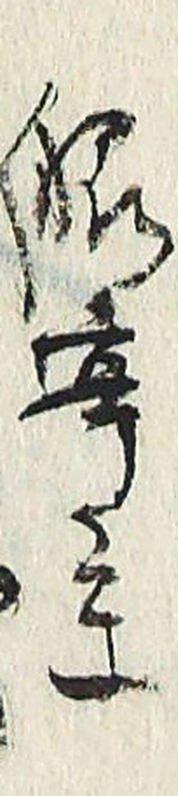脇亭主
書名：公辺御役人為御廻浦御立越諸御用一巻
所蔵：鳴門教育大学 Naruto University of Education
